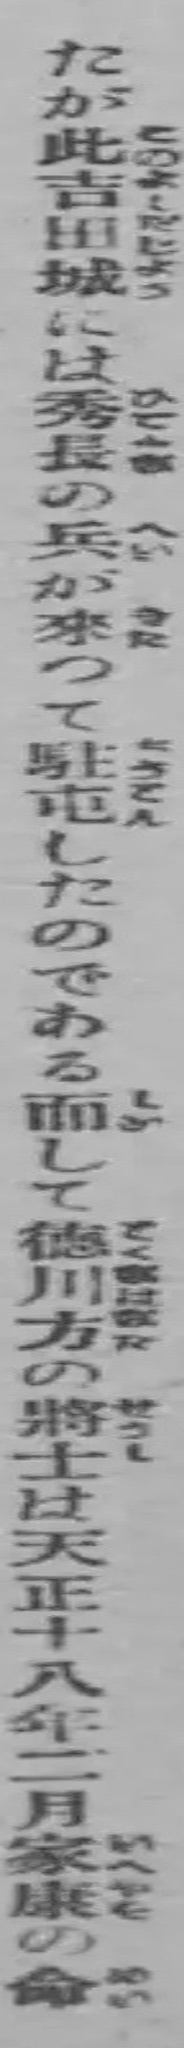屯すたが此吉田城には秀長の兵が来つて駐屯したのである而して徳川方の将士は天正十八年二月家康の命
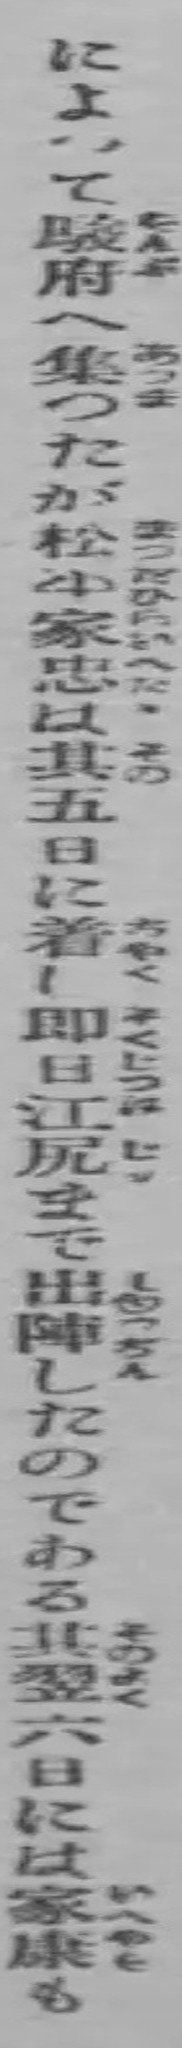によつて駿府へ集つたが松平家忠は其五日に着し即日江尻まで出陣したのである其翌六日には家康も
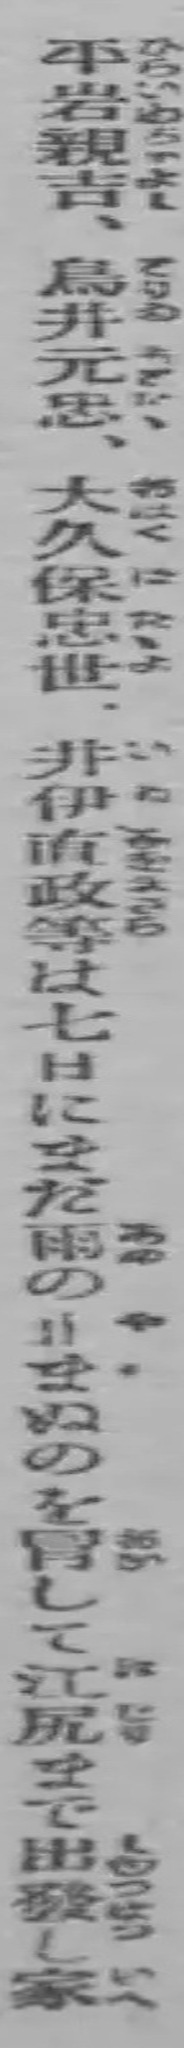平岩親吉、鳥居元忠、大久保忠世、井伊直正等は七日にまだ雨の止むまぬのを冒して江尻まで出発し家
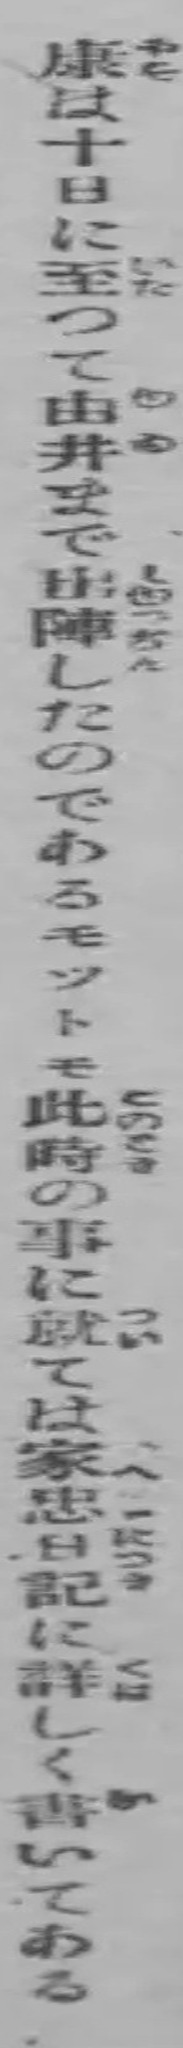康は十日に至つて由井まで出陣したのであるモツトモ此時の事について就ては家忠日記に詳しく書いてある
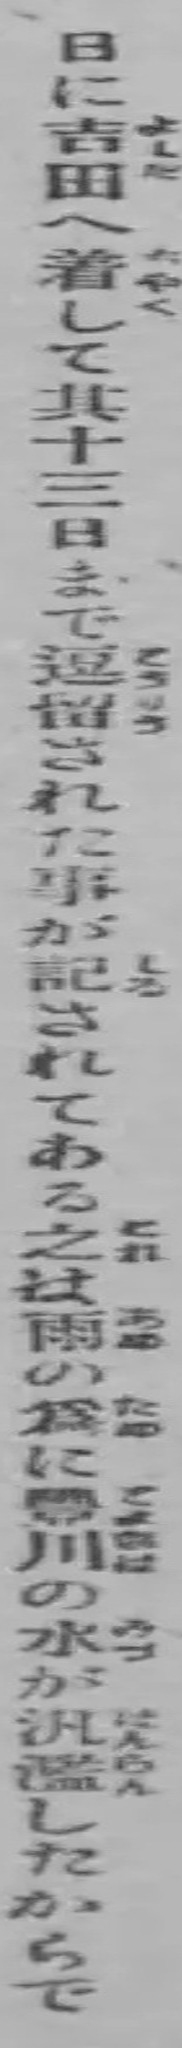日に吉田へ着して其十三日まで逗留された事が記されてある之は雨の為に豊川の水が汎濫したからで
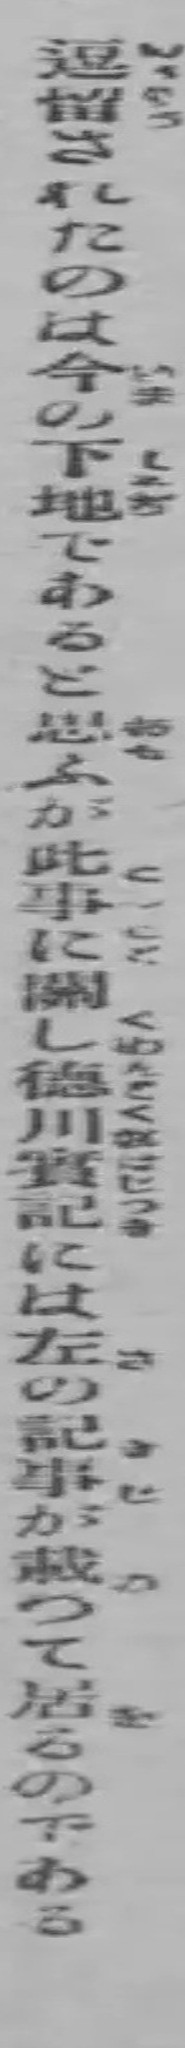逗留されたのは今の下地であると思ふが此事に関し徳川実記には左の記事が載つて居るのである
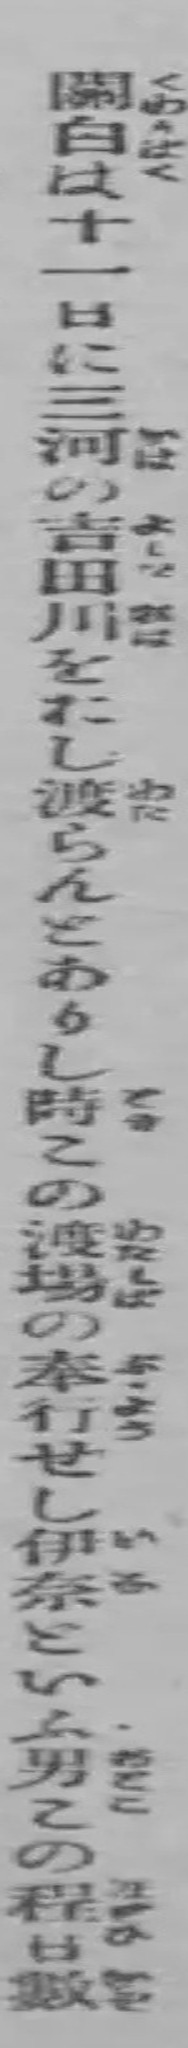関白は十一日に三河の吉田川をおし渡らんとありし時この渡場の奉行せし伊奈といふ男この程日数
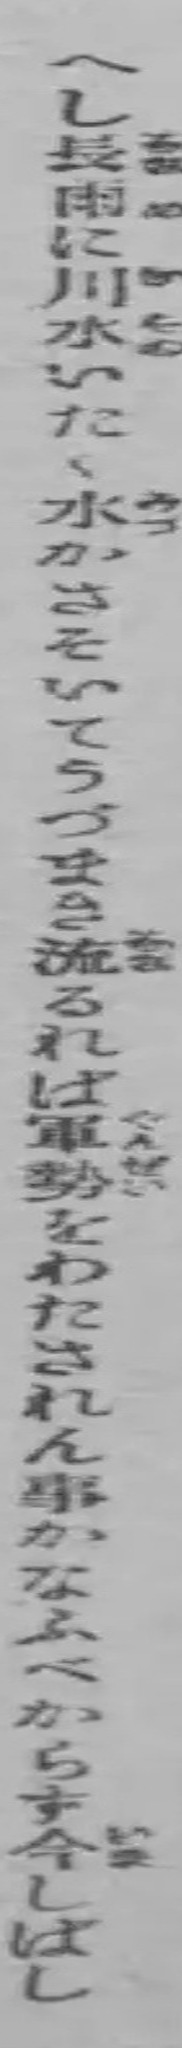へし長雨に川水いたく水かさそいてうづまき流るれば軍勢をわたされん事かなふべからず今しばし
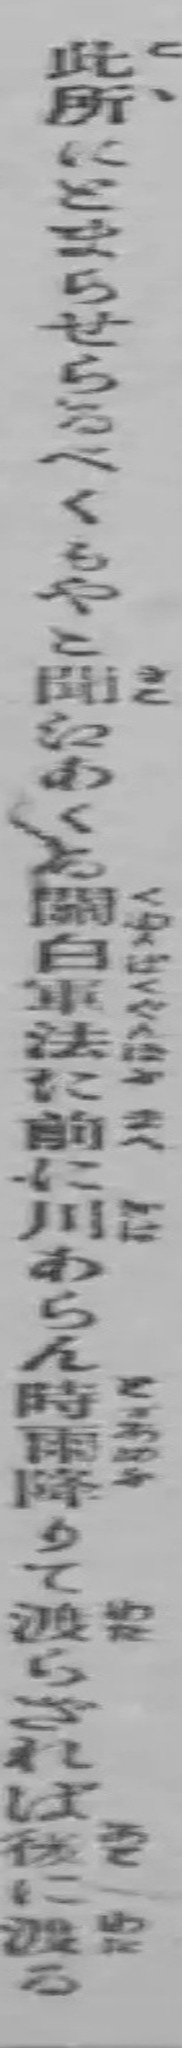此所にとまらせらるべくもやと聞えあくる関白軍法に前に川あらん時雨降りて渡らざれば後に渡る
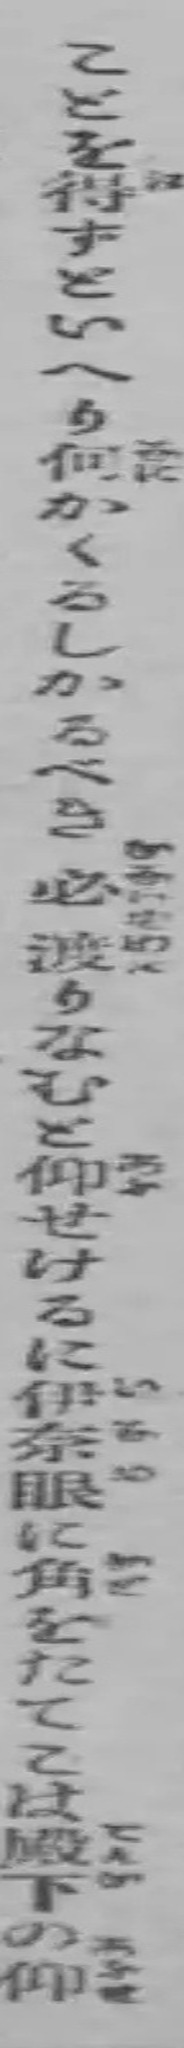ことを得ずといへり何かくるしかるべき必渡りなむと仰せけるに伊奈眼に角をたてこは殿下の仰
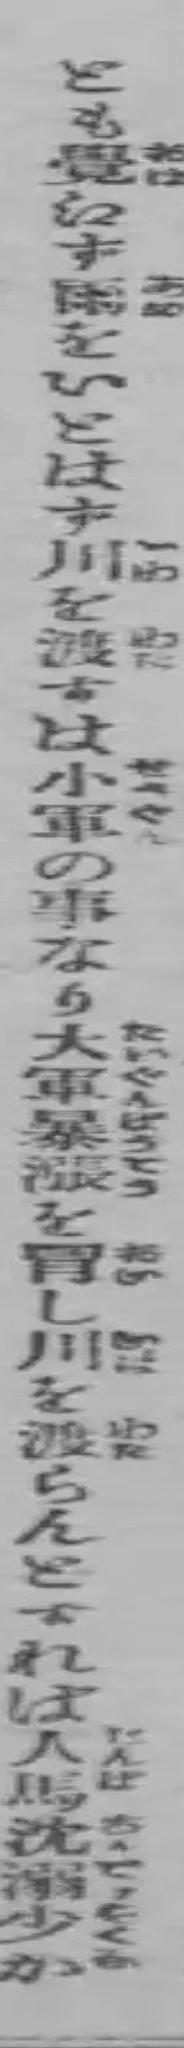とも覚えず雨をいとはず川を渡すは小軍の事なり大軍暴漲を冒し川を渡らんとすれば人馬沈溺少か
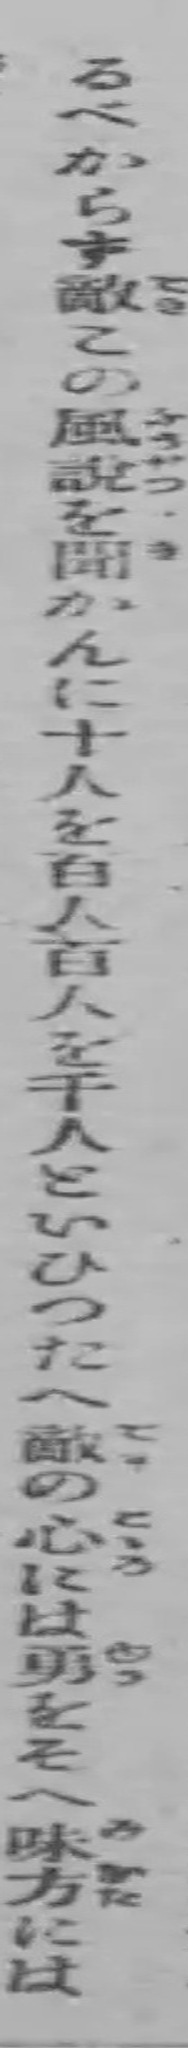るべからず敵この風説を聞かんに十人を百人百人を千人といひつたへ敵の心には勇をそへ味方には
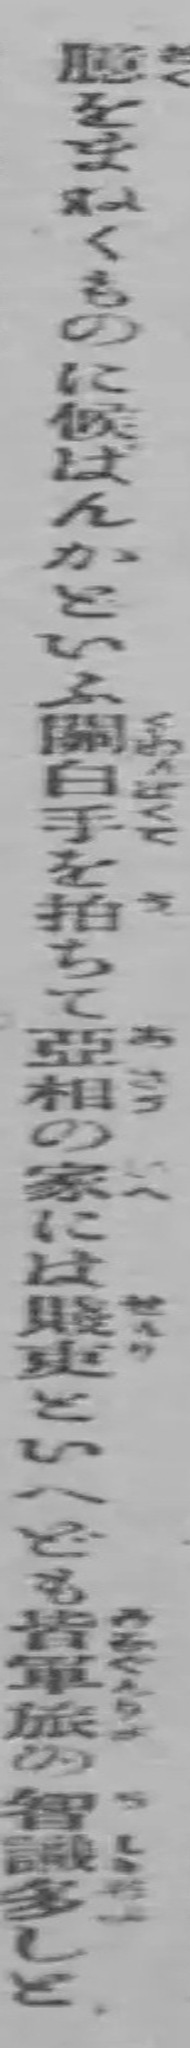臆をまねくものに候はんかといふ関白手を拍ちて亜相の家には賤吏といへども皆軍旅の智識多しと
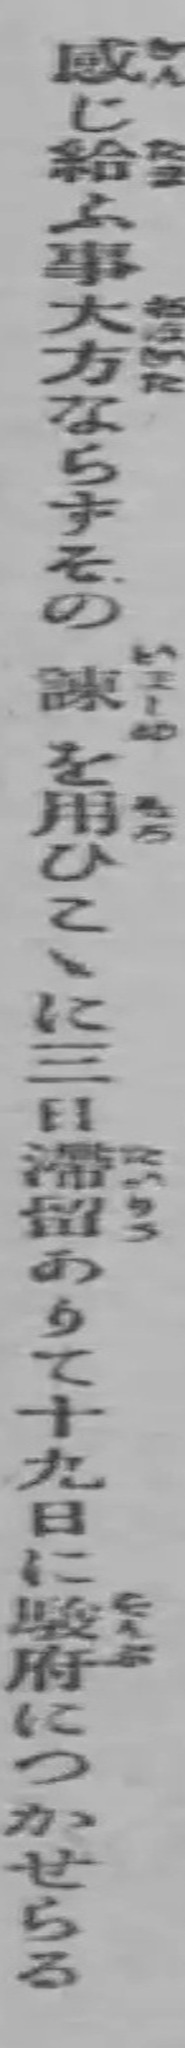感じ給ふ事大方ならずその諫を用ひこゝに三日滞留あり十九日に駿府につかせらる

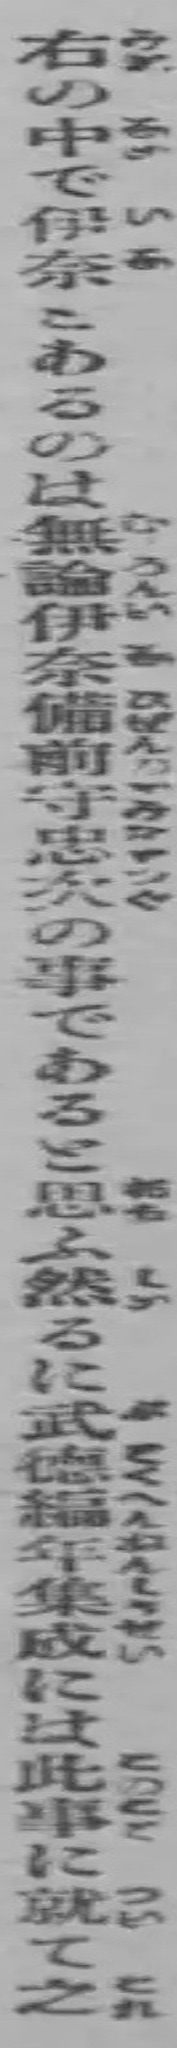右の中で伊奈とあるのは無論伊奈備前守忠次の事であると思ふ然るに武徳編年集成には此事に就て之
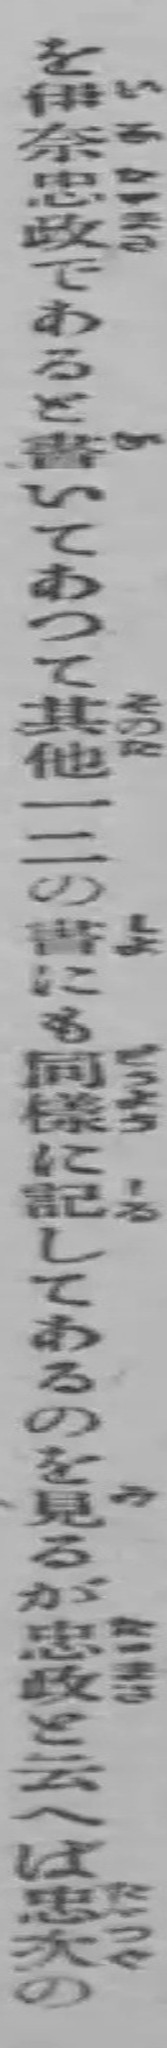を伊奈忠政であると書いてあつて其他一二の書にも同様に記してあるのを見るが忠政と云へば忠次の
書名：豊橋市史談
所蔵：国立国会図書館 National Diet Library, JAPAN
